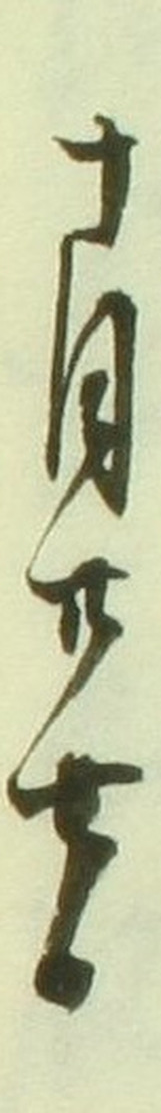十月廿七日
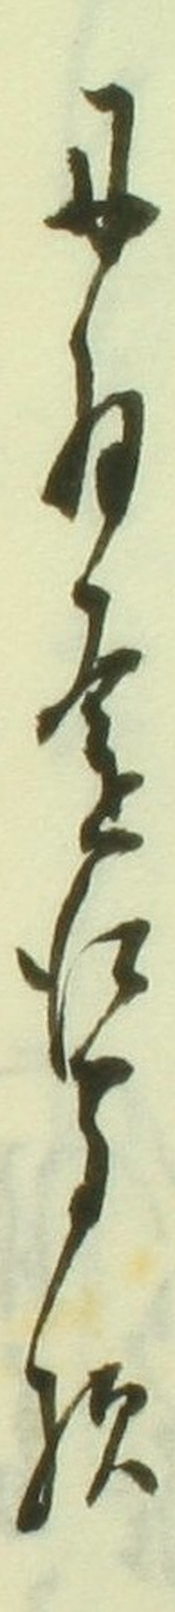丹羽遠江守様
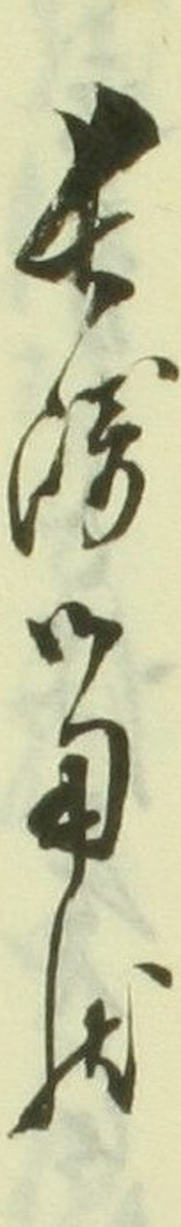長崎御用状
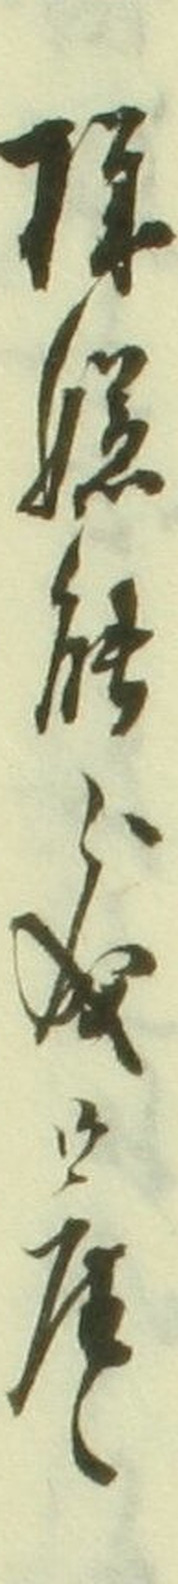機嫌能被成御座候
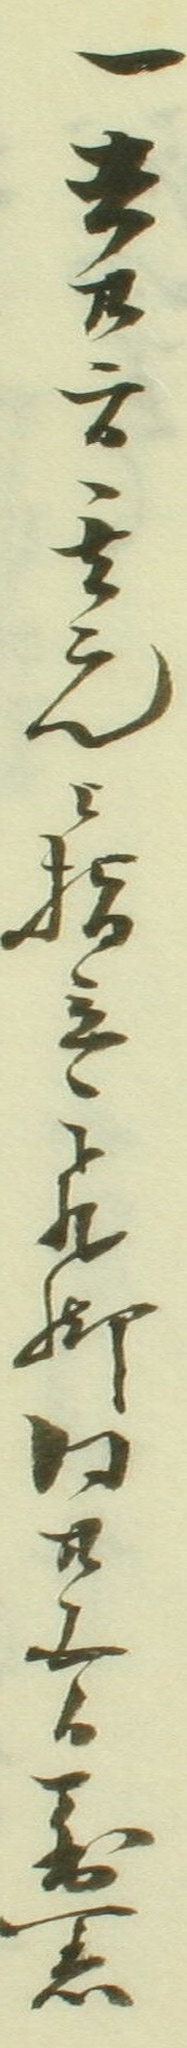一去廿二日其元被指立候飛脚同廿五日到着
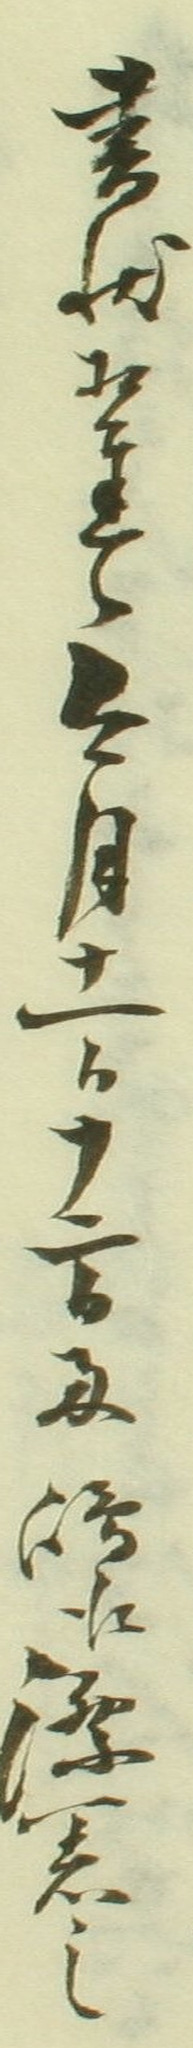書状相達候今月十一日十二日両嶋江漂着之
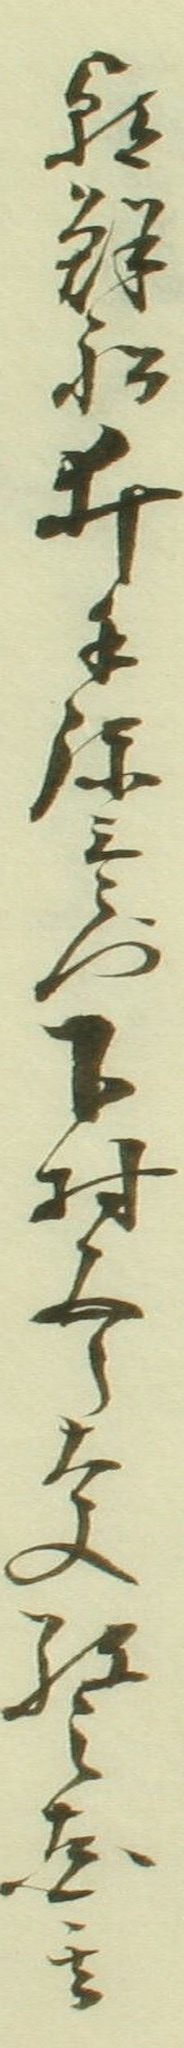朝鮮船井手弥三右衛門下村五郎太夫警固其
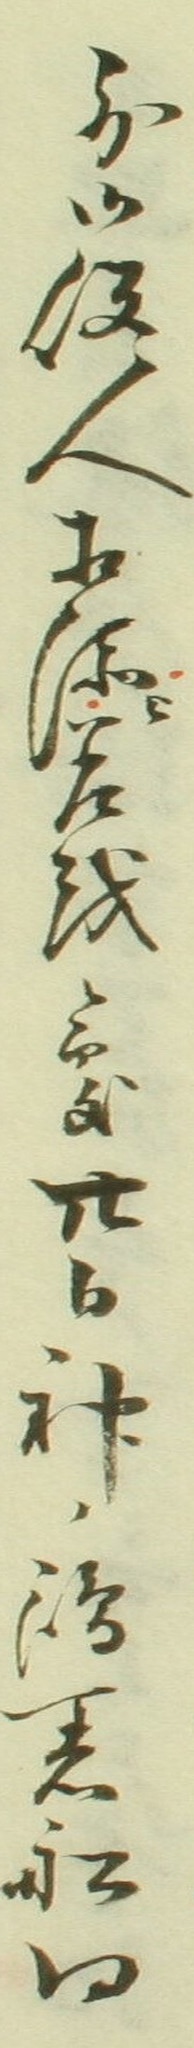外御役人相添被差越候処廿日神ノ嶋着船同
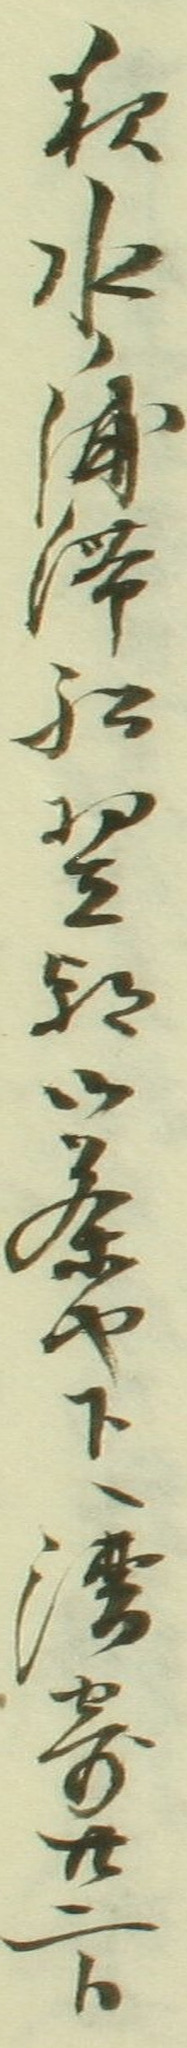夜水ノ浦滞船翌朝御茶ヤ下へ漕寄廿二日
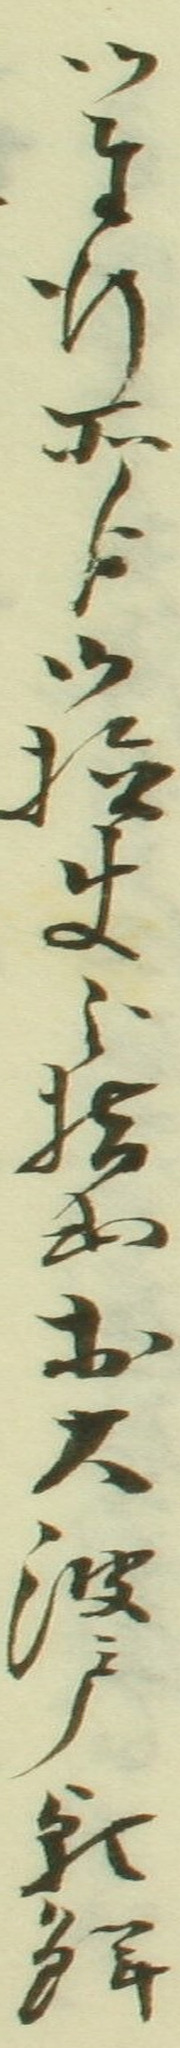御奉行所ゟ御検使被指出於大波戸朝鮮
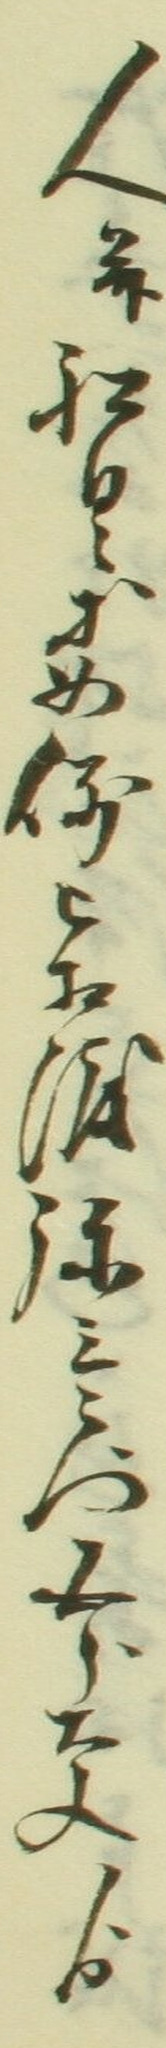人并船具等如例被相渡弥三右衛門五郎太夫ゟ

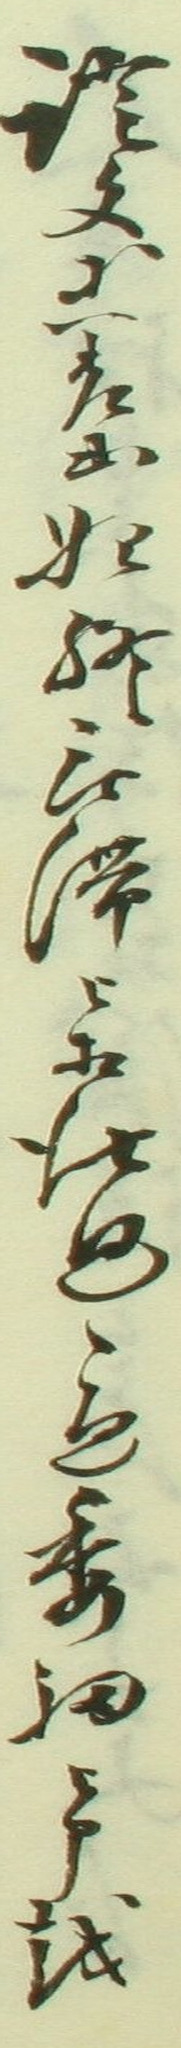証文等差出始終無滞被相仕廻候通委細被申越
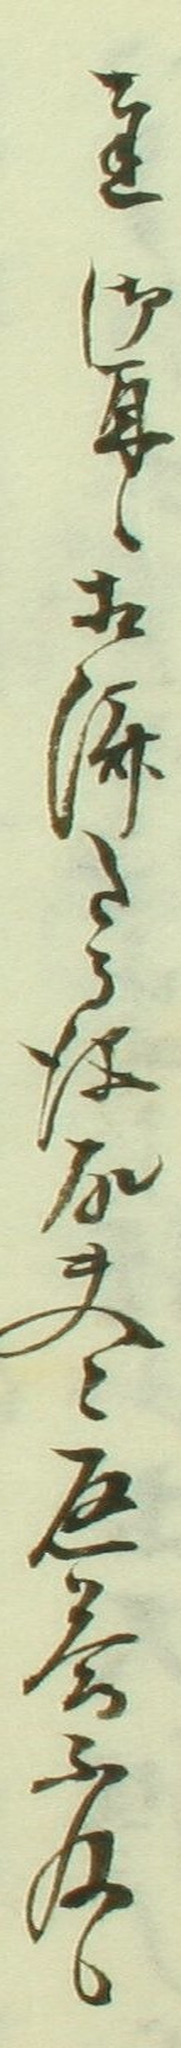達御耳候相済たる儀故夫々返答不及候
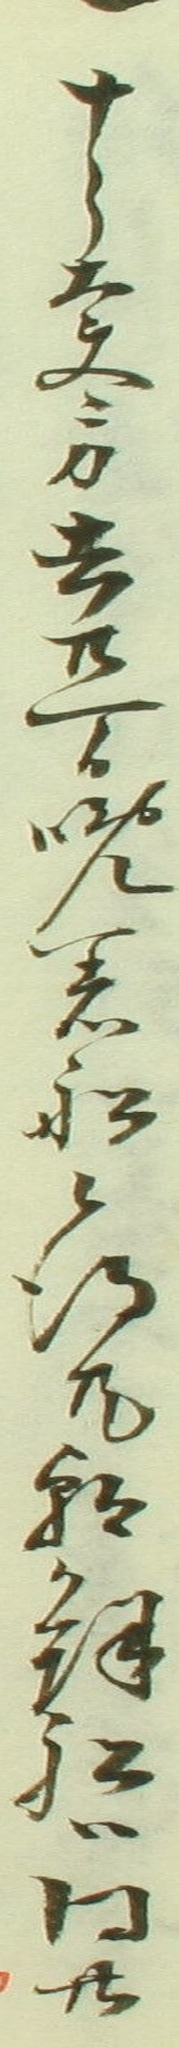一十郎太夫方去廿一日晩着船候得共朝鮮船ハ同廿
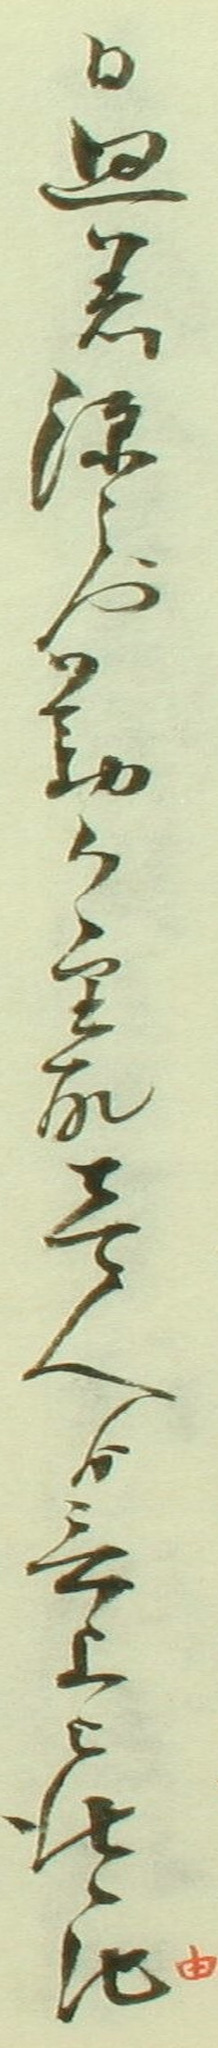日廻着源右衛門勤か望故壱人ゟ言上被仕由
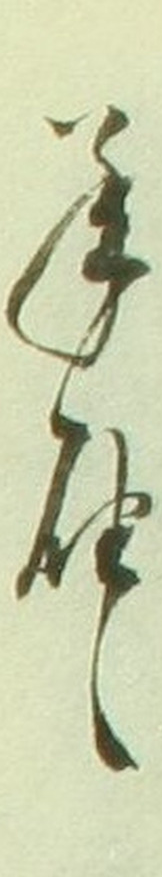承届候
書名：異国船漂着記
